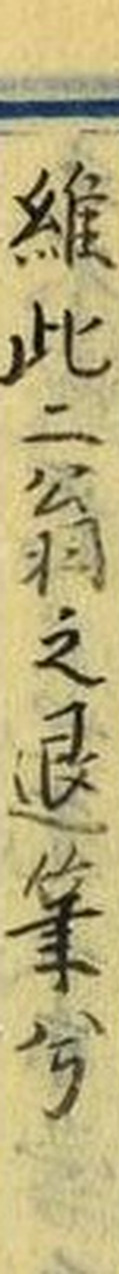維此二翁之退筆兮
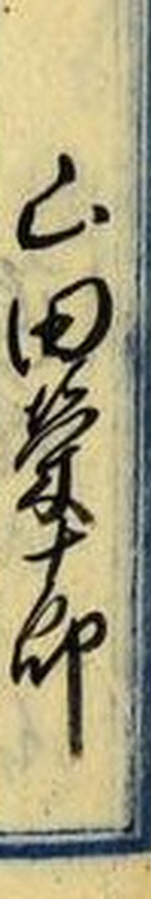山田栄十郎
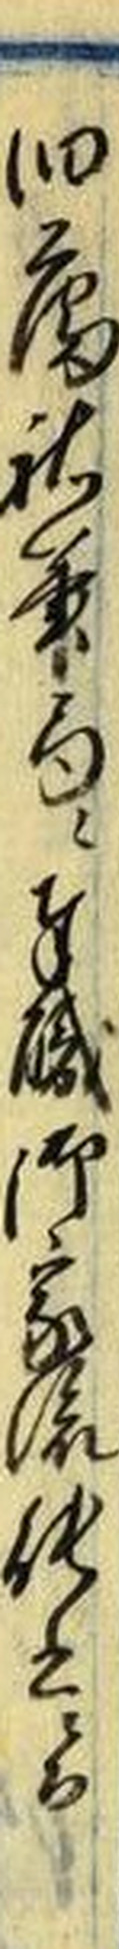旧藩祐筆局に奉職御家流能書に而先粛
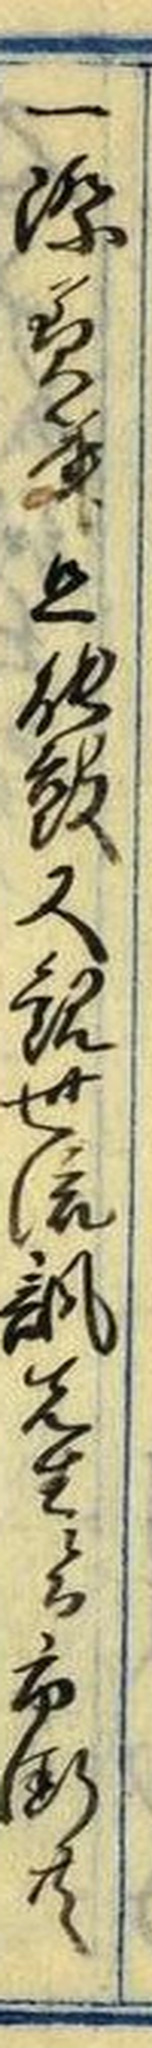一際美筆且能鼓又観世流諷先生に而市街共
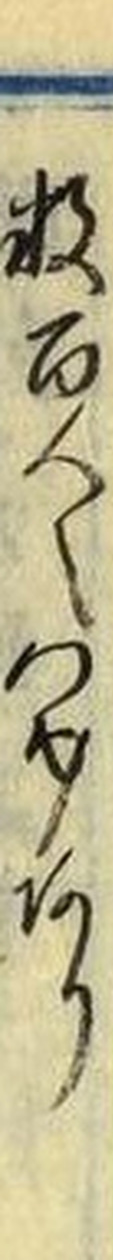数百人之門才あり
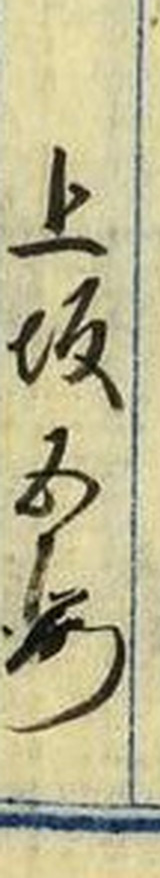上坂五右衛門
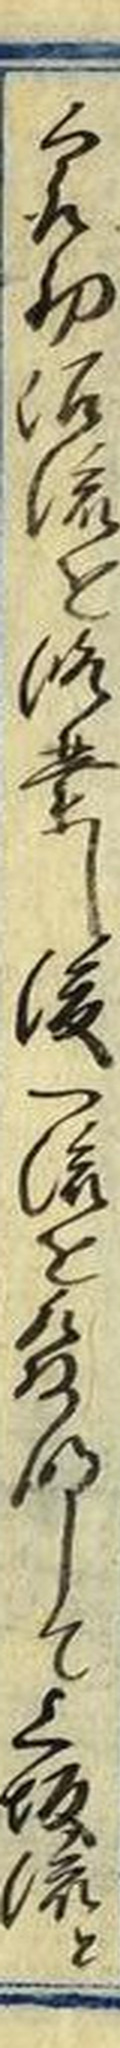最初沼流を修業し後一流を発明して上坂流と
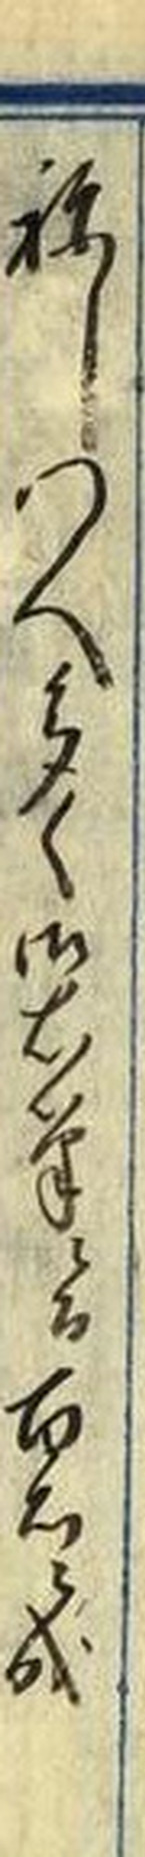称し門人多く御右筆に而百石に成
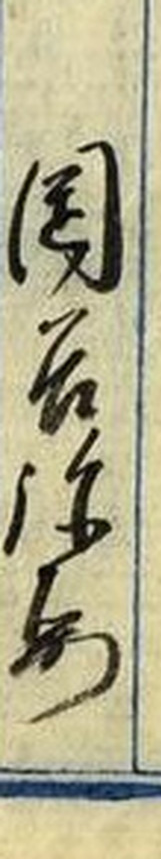岡谷弥右衛門
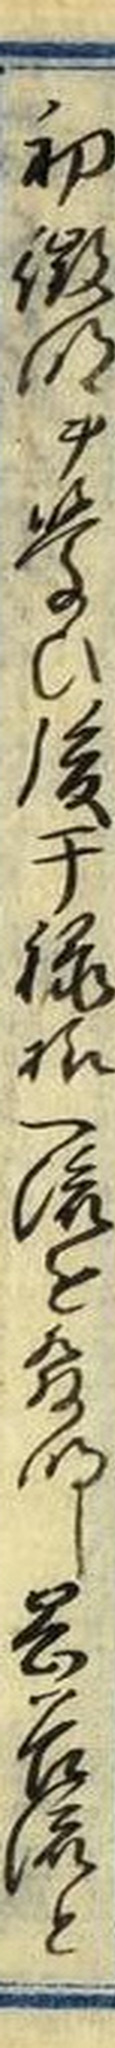初徴明を学ひ後干禄様一流を発明し岡谷流と
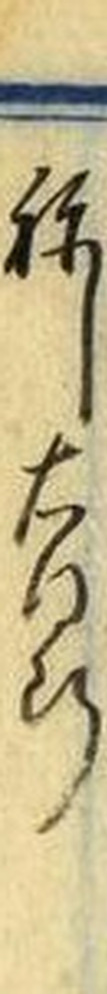称し右同断

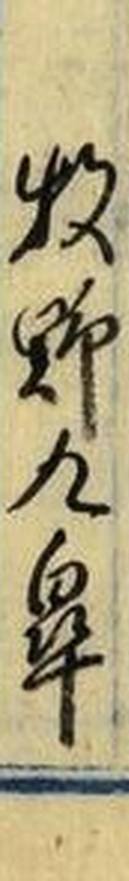牧野九皐
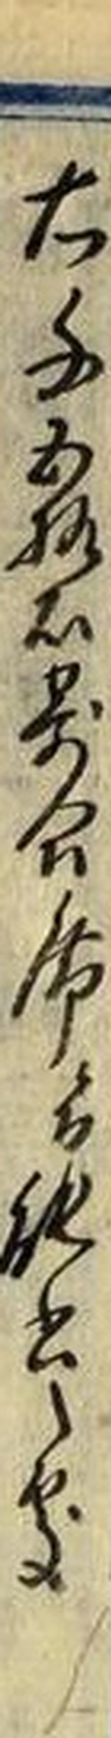右千五拾石寄合席に而能書之処主膳
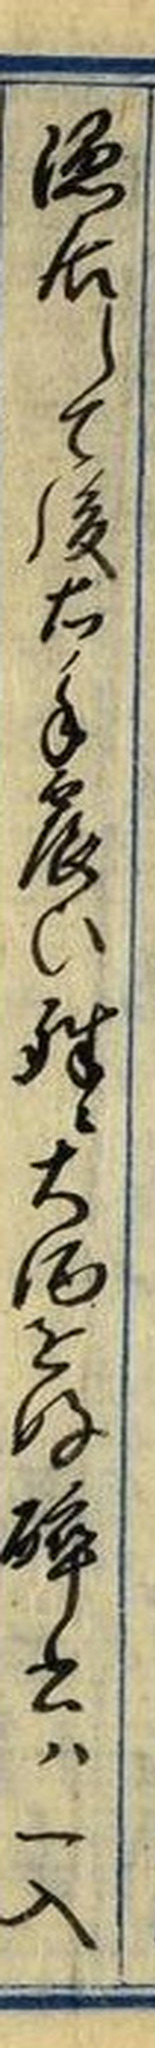隠居して後右手震い殊に大酒を好酔書は一入
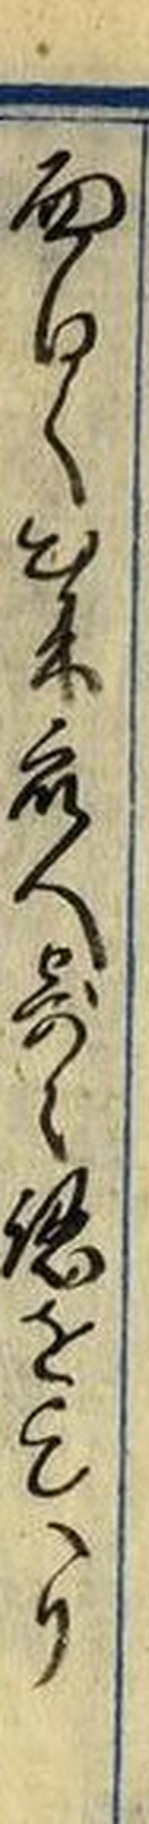面白く出来衆人寄々認を乞へり
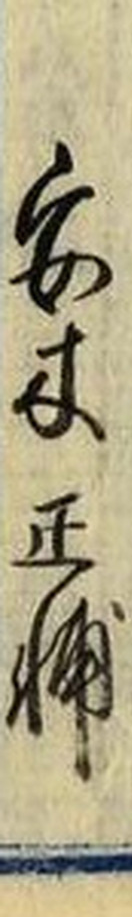安木正輔
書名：温古集 四巻
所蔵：福井県文書館 Fukui Prefectural Archives
